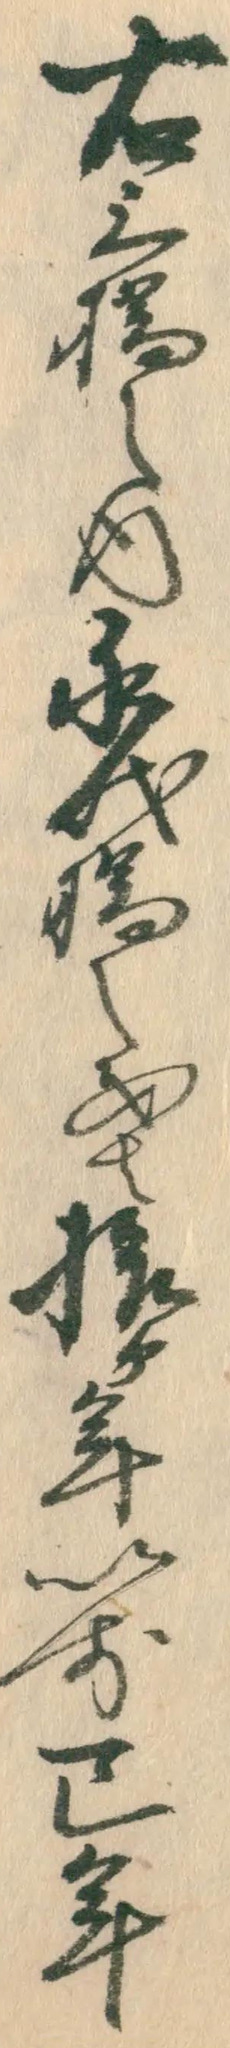右三橋之内永代橋之義は拾ケ年以前巳年

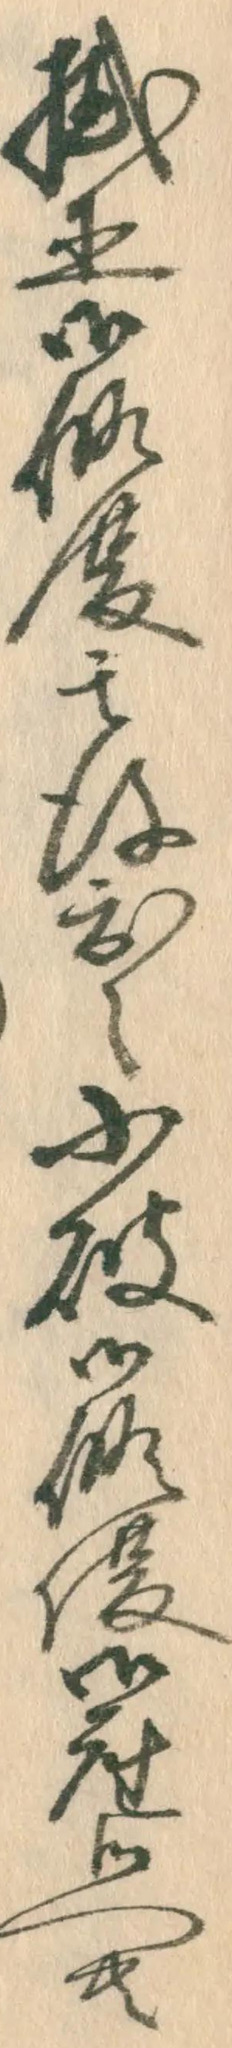掛直御修復其後度々小破御修復御座候へ共
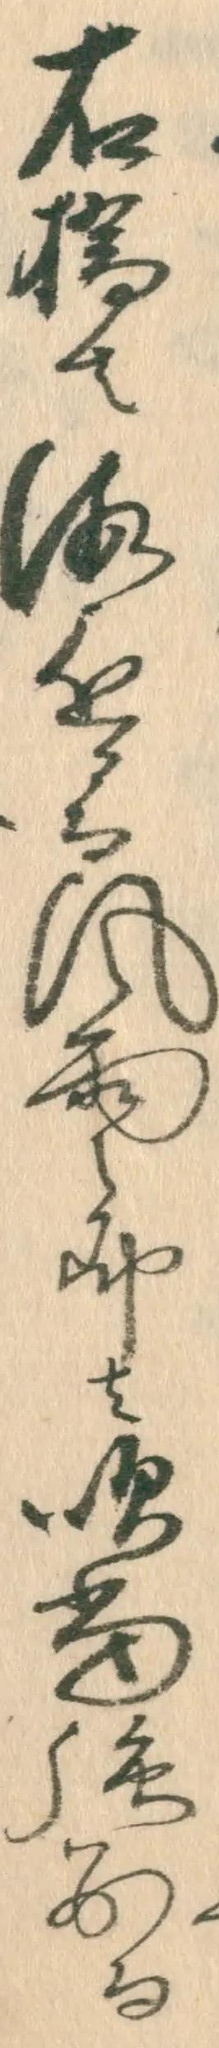右橋は海近ニ而風雨之節は吹当強別而
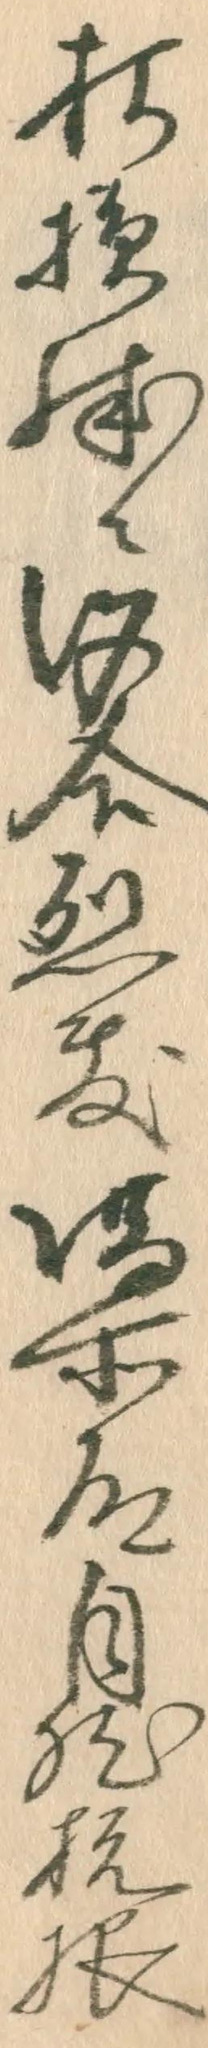折損殊ニ汐合烈敷場所故自然杭根
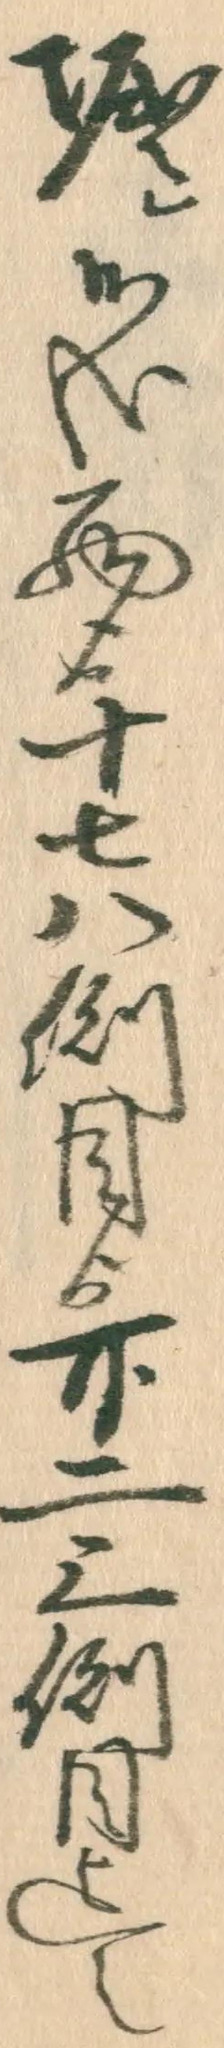掘レ候哉西ゟ十七八側目ゟ廿二三側目迄之
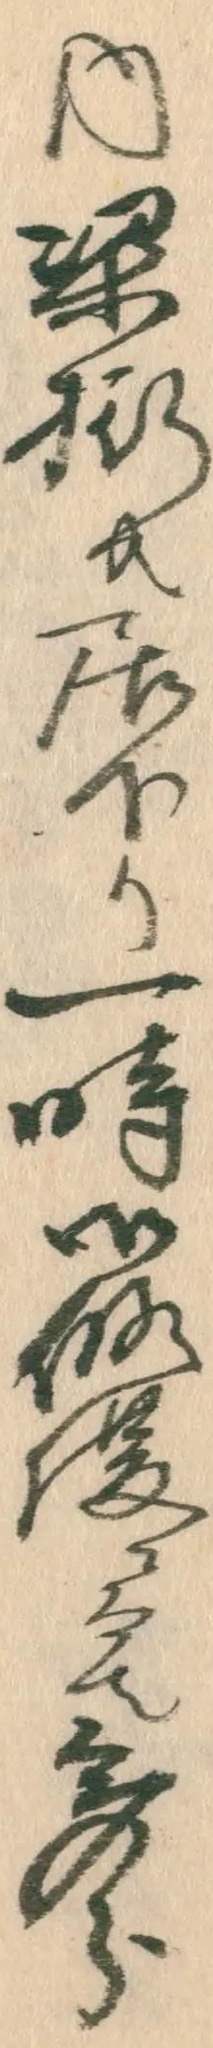内梁桁共居下り一時御修復ニ而は多分
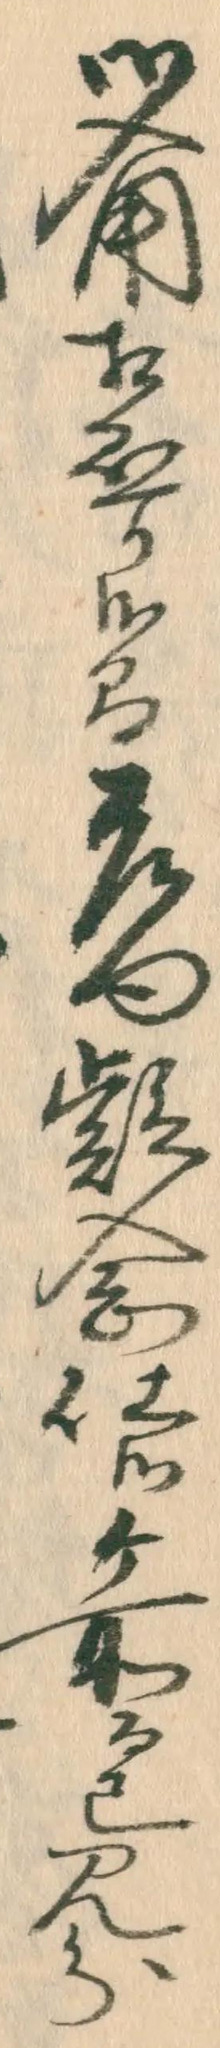御入用相懸り候間差向疑念仕候ケ所而已見分
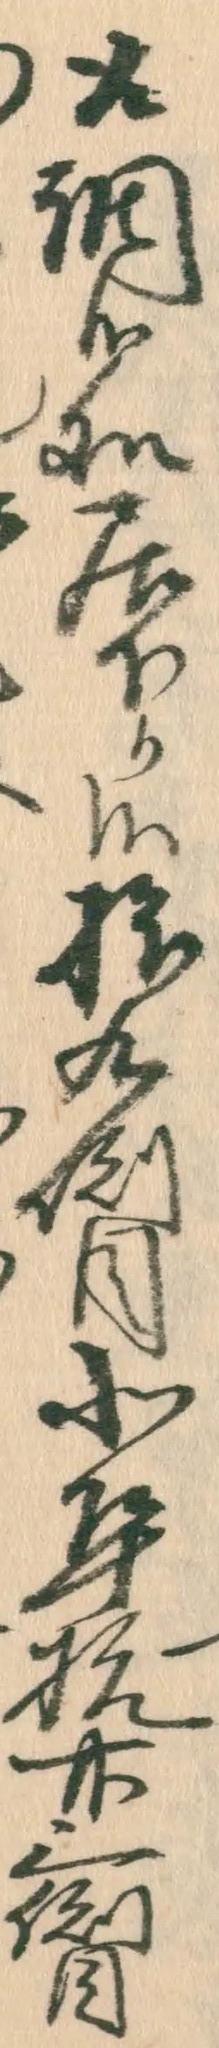取調候処居下り候拾九側目北耳杭廿三側目
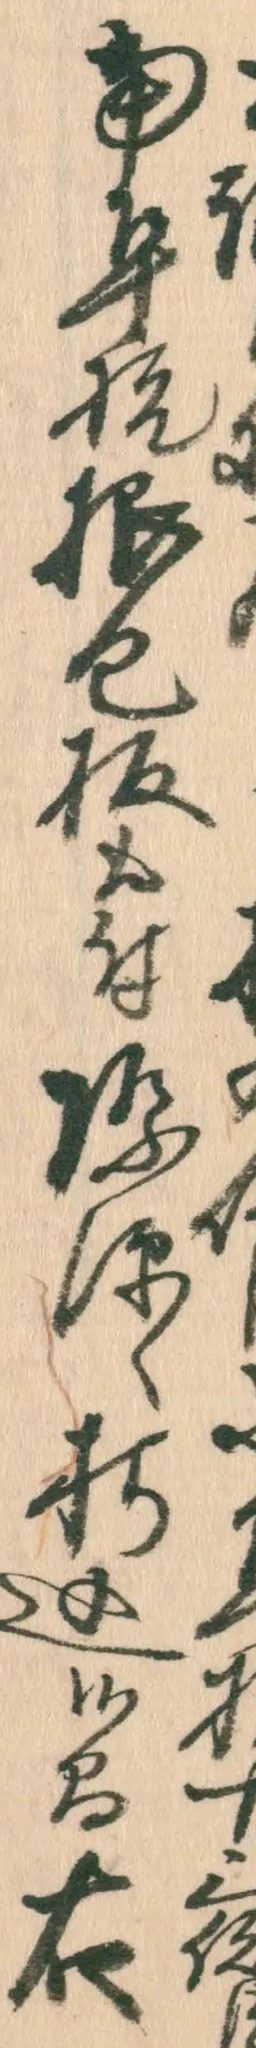南耳杭根包板取付際深く朽込候間右
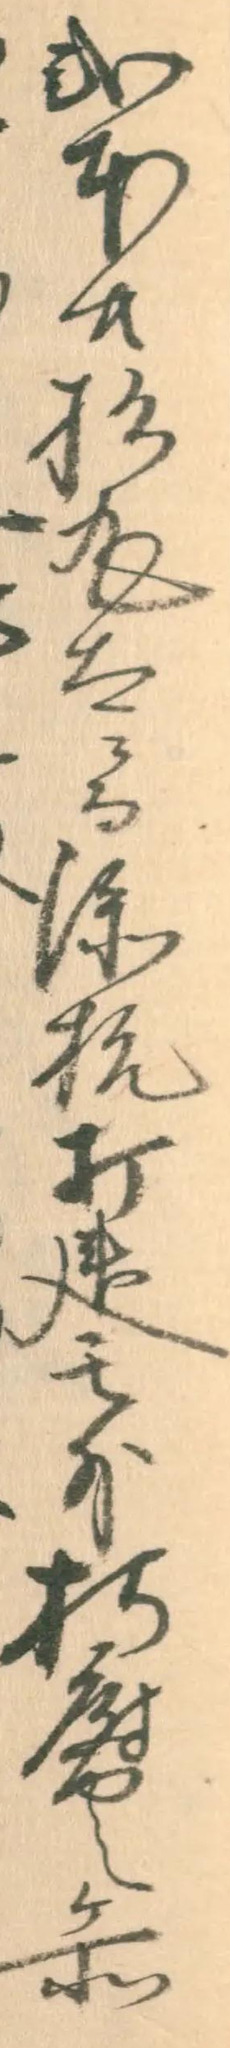弐本共杉丸太ニ而添杭打建其外朽腐之ケ所
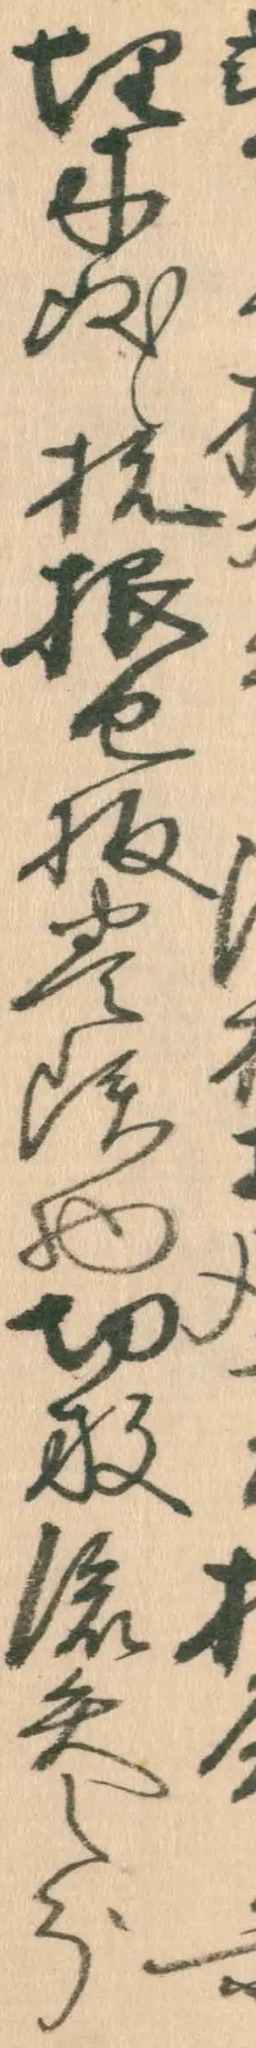埋木致し杭根包板巻鉄物切放流失之分
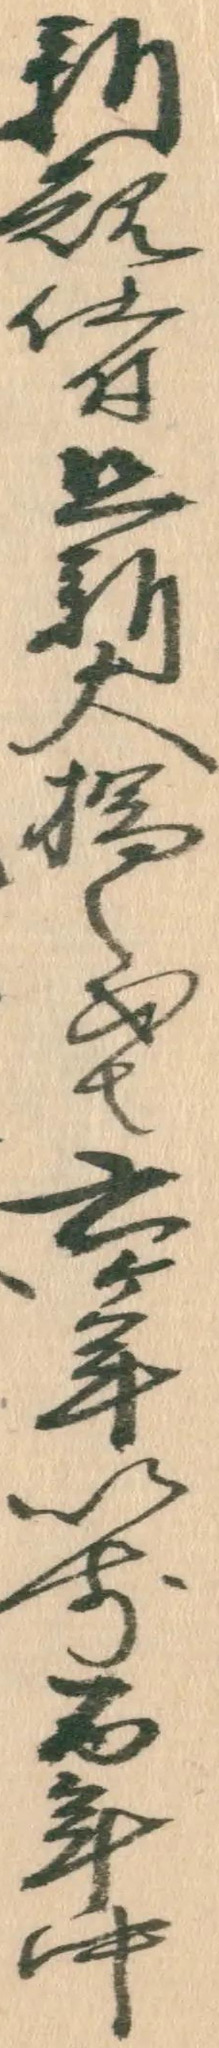新規仕付且新大橋之義は六ケ年以前酉年中
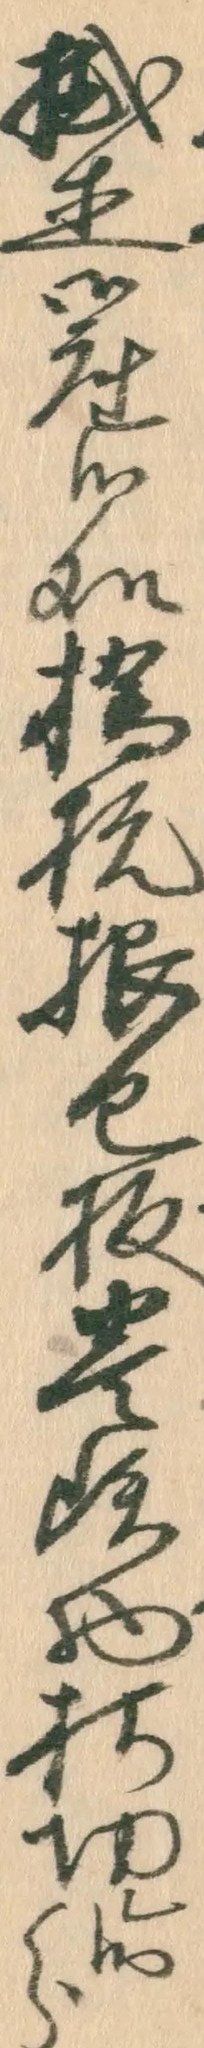掛直御座候処橋杭根包板巻鉄物朽切レ候分
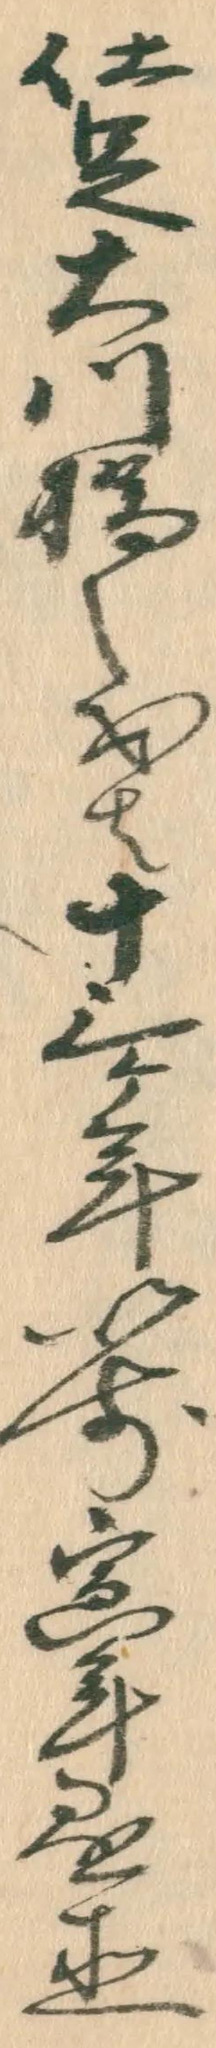仕足大川橋之義は十三ケ年以前寅年懸直
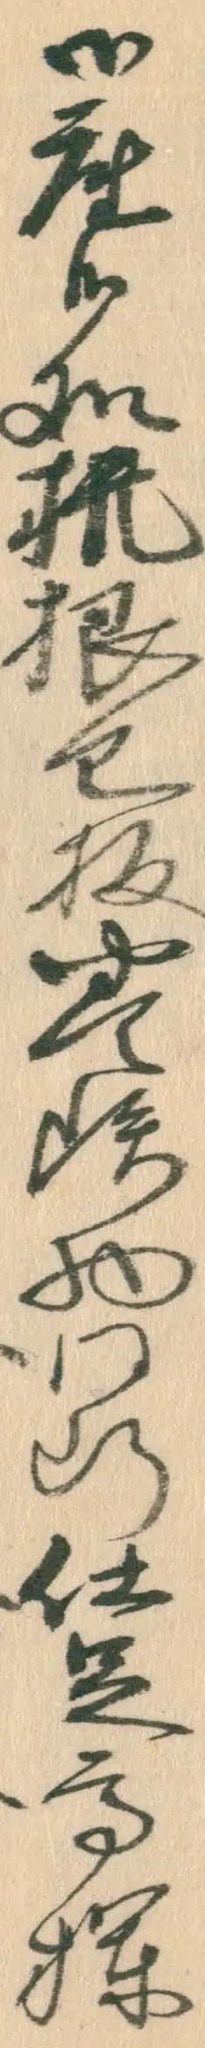御座候処杭根包板巻鉄物同断仕足高欄
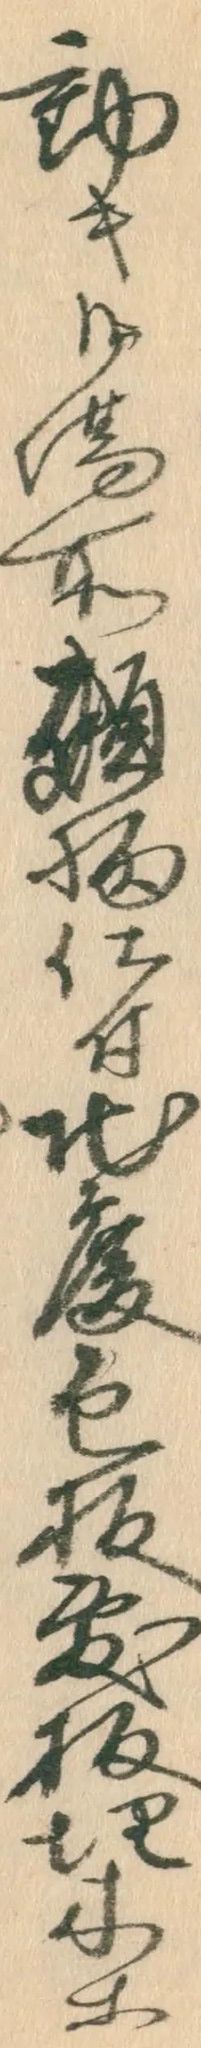動キ候場所頬柄仕付地覆包板敷板埋木等
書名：三橋 17巻. [8] 三橋小破御修復書留　但御奉行御掛リ替地震潰橋番屋　嘉永四亥年より安政二卯年迄　下
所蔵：国立国会図書館 National Diet Library, JAPAN
